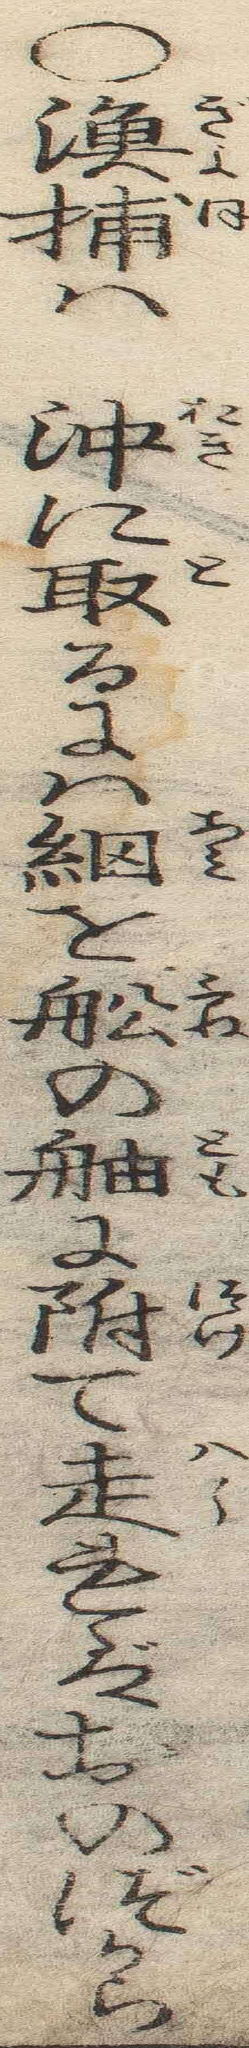○漁捕は沖に取るには網を舩の舳に附て走ればおのづから
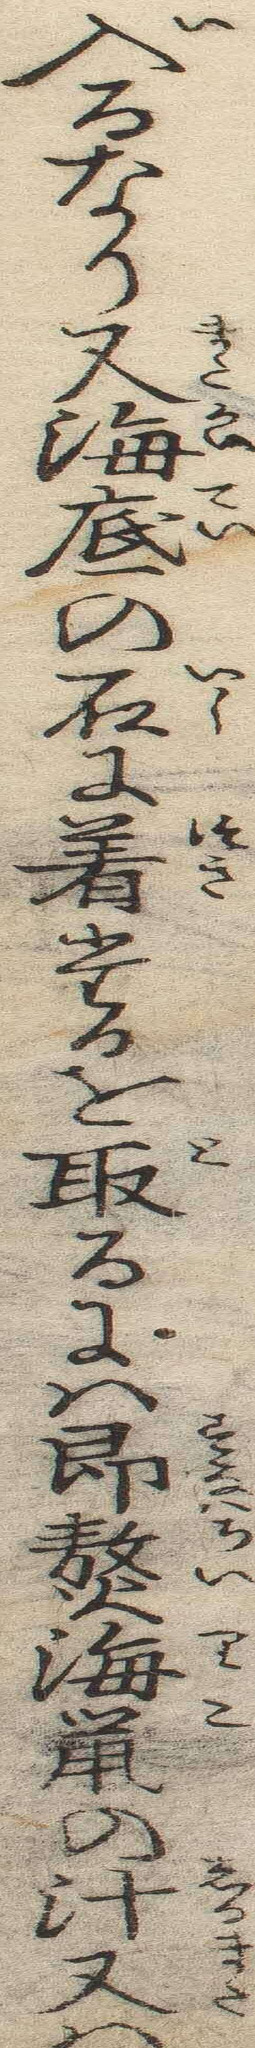入るなり又海底の石に着たるを取るには即熬海鼠の汁又は

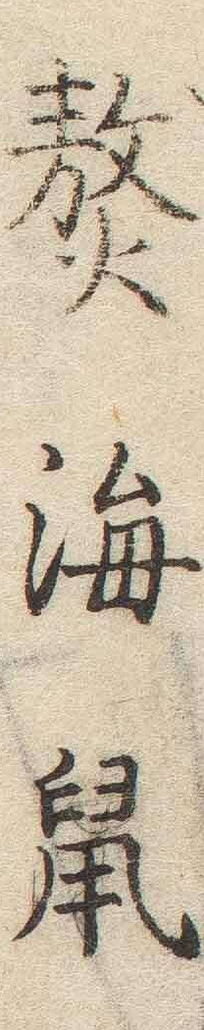熬海鼠
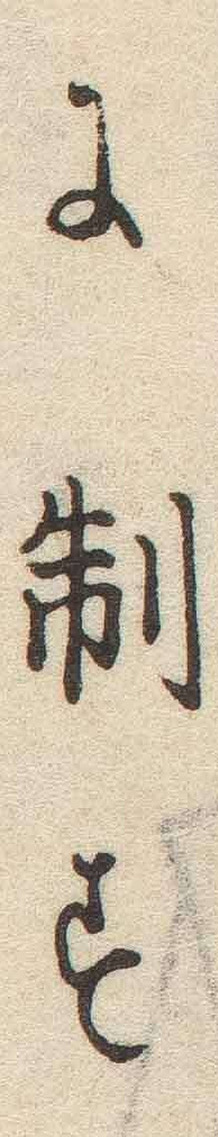に制を

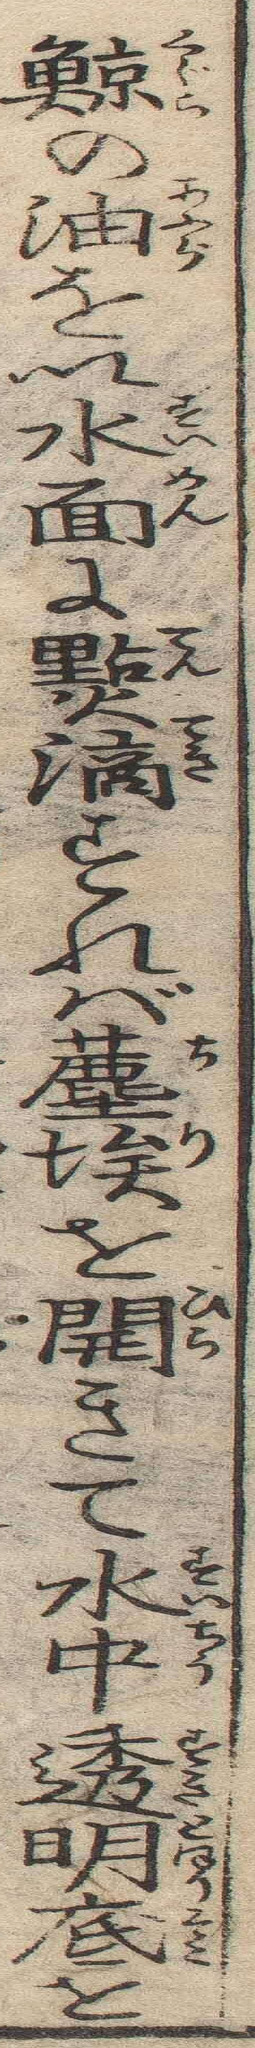鯨の油を以水面に点滴すれば塵埃を開きて水中透明底
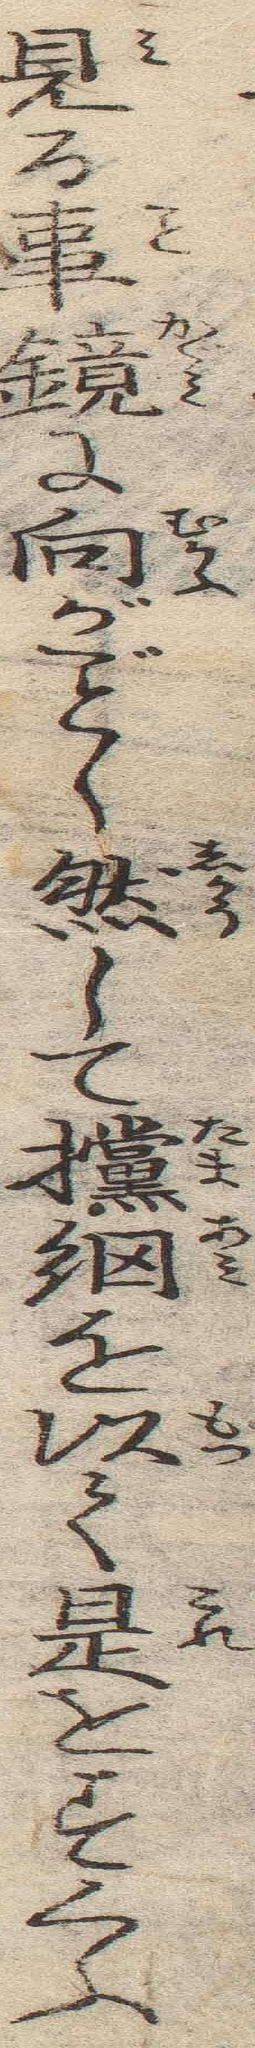見る事鏡に向がごとし然して攩網を以て是をすくふ
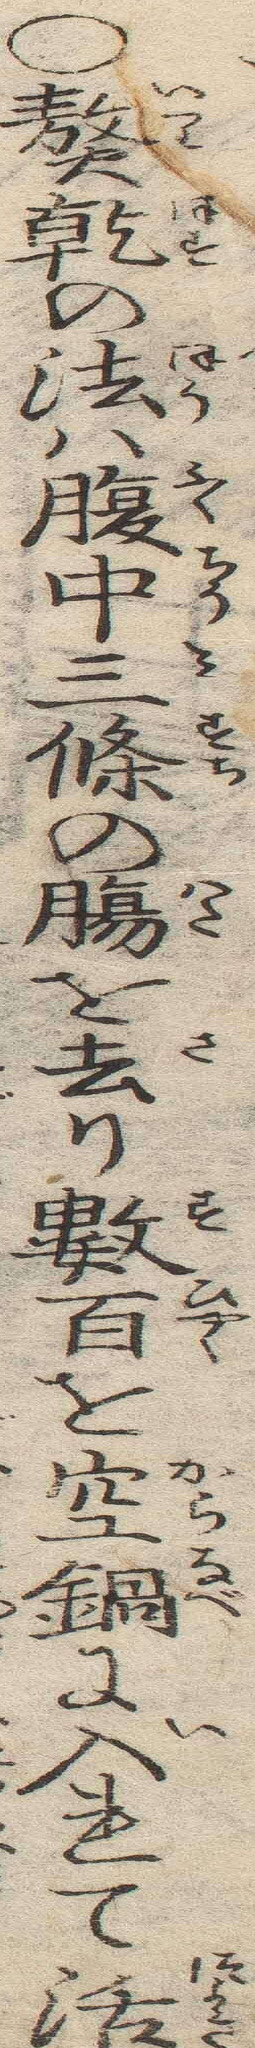○熬乾の法は腹中三条の腸を去り数百を空鍋に入れて活
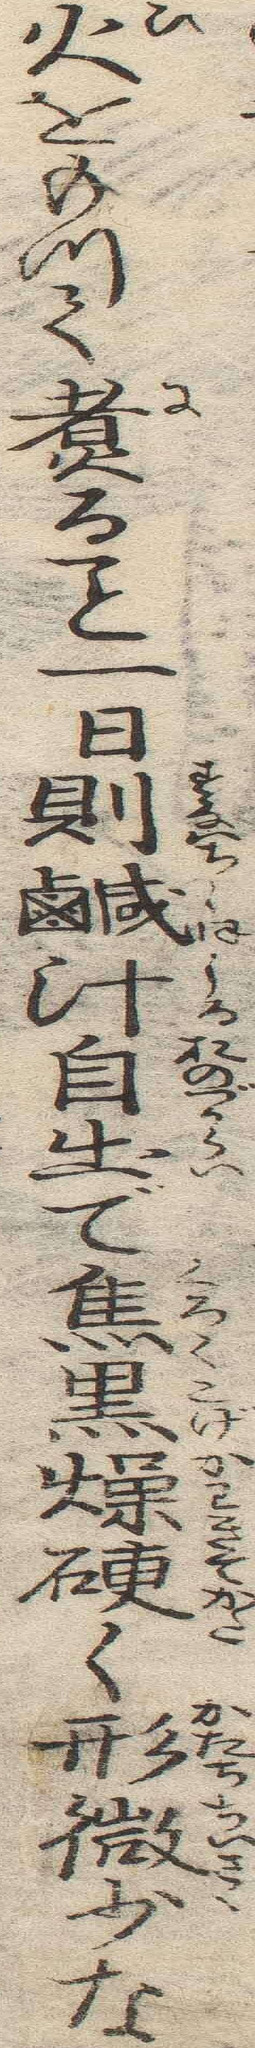火をもつて煮ること一日則鹹汁自出で焦黒燥硬く形微少な
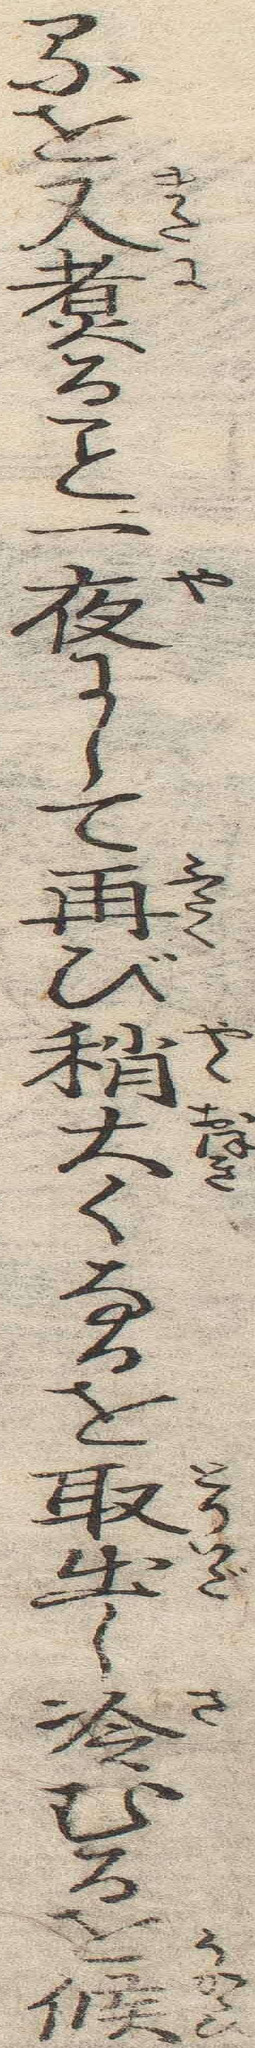るを又煮ること一夜にして再び稍大くなるを取出し冷むるを候
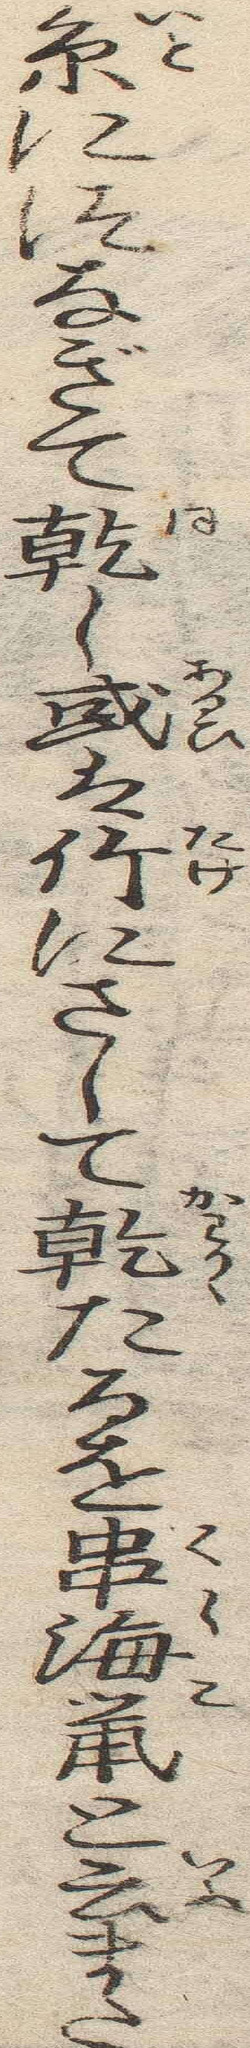糸につなぎて乾し或は竹にさして乾たるを串海鼠と云また
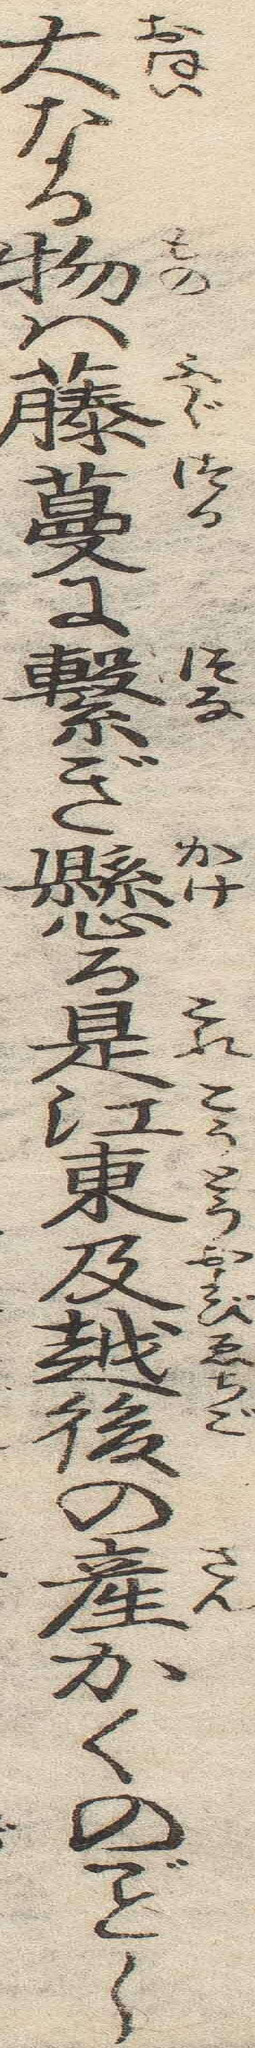大なる物は藤蔓に繋ぎ懸る是江東及越後の産かくのごとし
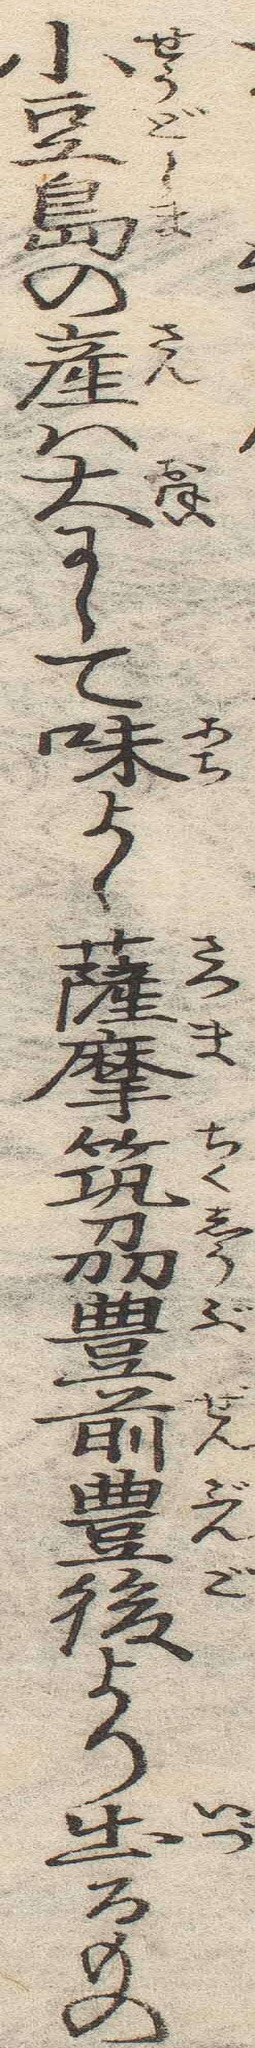小豆島の産は大にして味よし薩摩筑州豊前豊後より出るもの
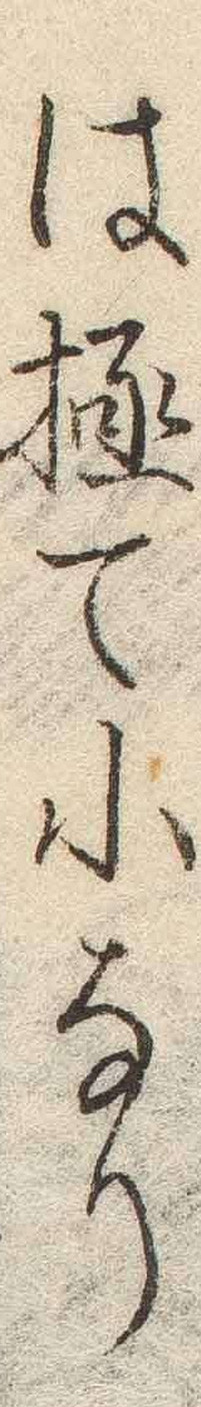は極て小なり
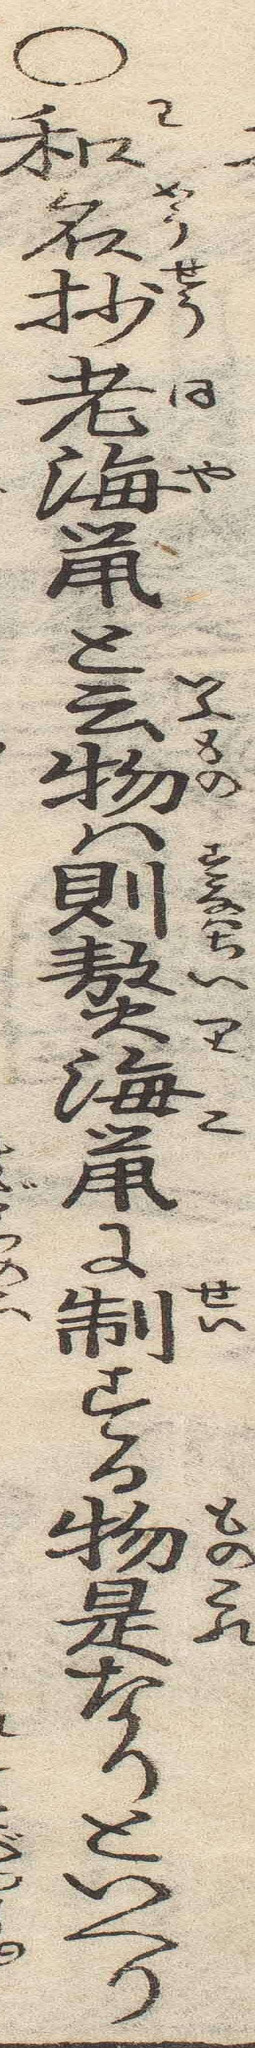○和名抄老海鼠と云物は則熬海鼠に制する物是なりといへり
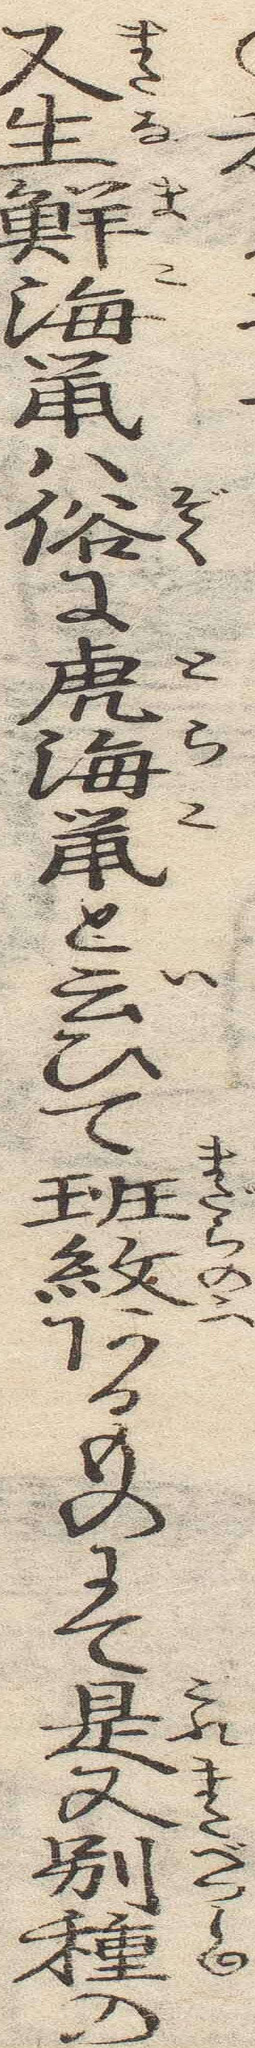又生鮮海鼠は俗に虎海鼠と云ひて班紋あるものにて是又別種の
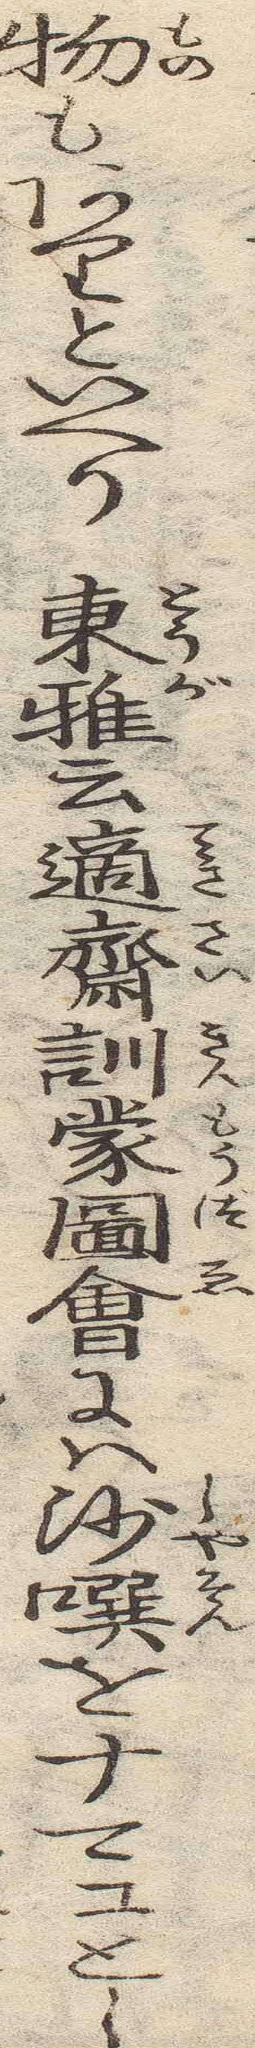物もありといへり東雅云適斎訓蒙図会には沙噀をナマコとし
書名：日本山海名産図会
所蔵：東京学芸大学附属図書館 国文学研究資料館
